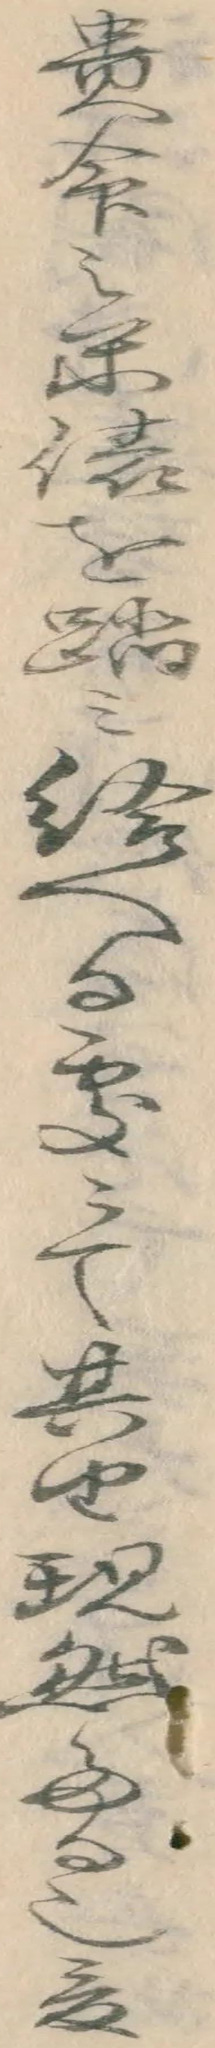貴命之米俵を踏み給へる処にて其由現然たる也爰
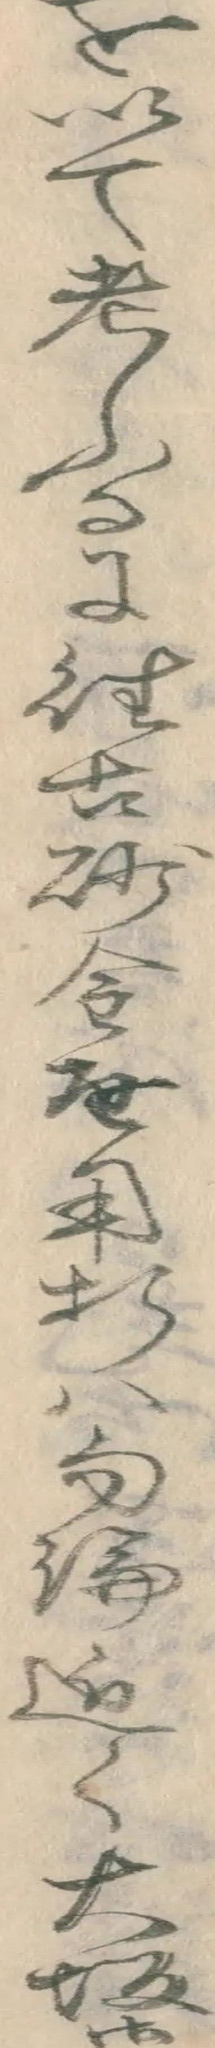を以て考ふるに往古砂金通用折は勿論近く大坂御
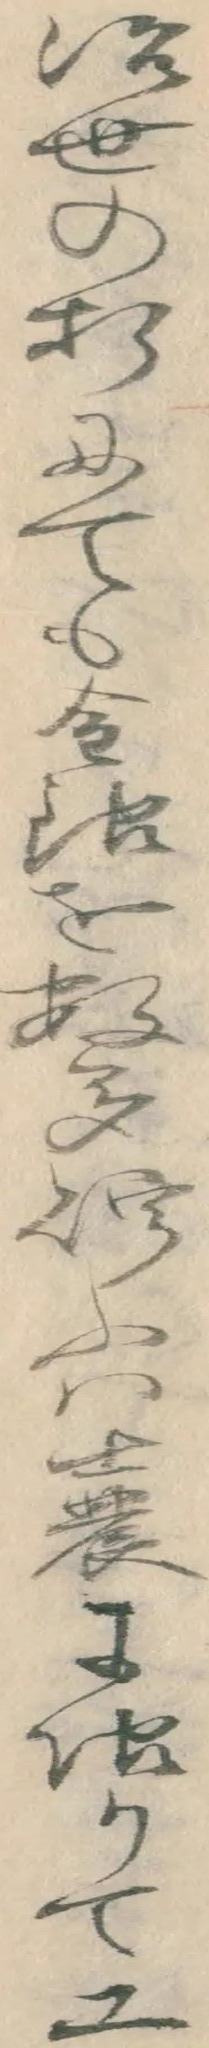治世の折にても金銀を数多貯ふは士農に限りて工
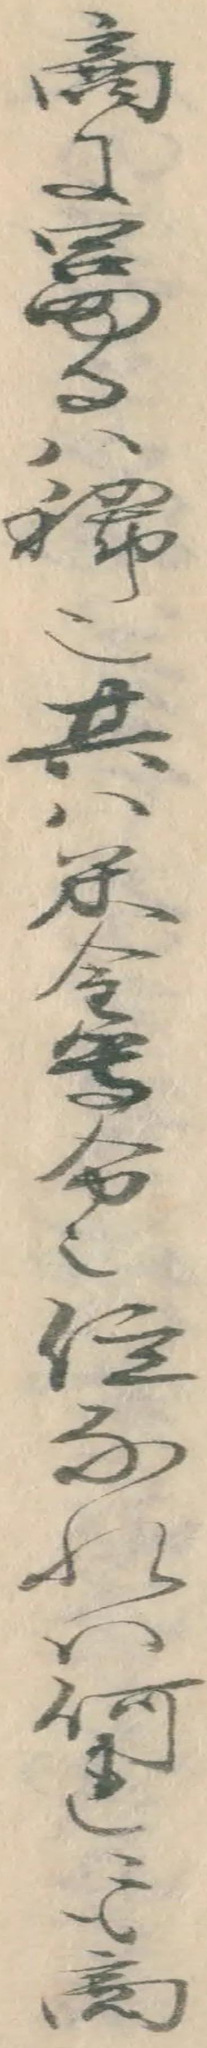商に富るは稀也其は米金等分之位なれは何れにも商

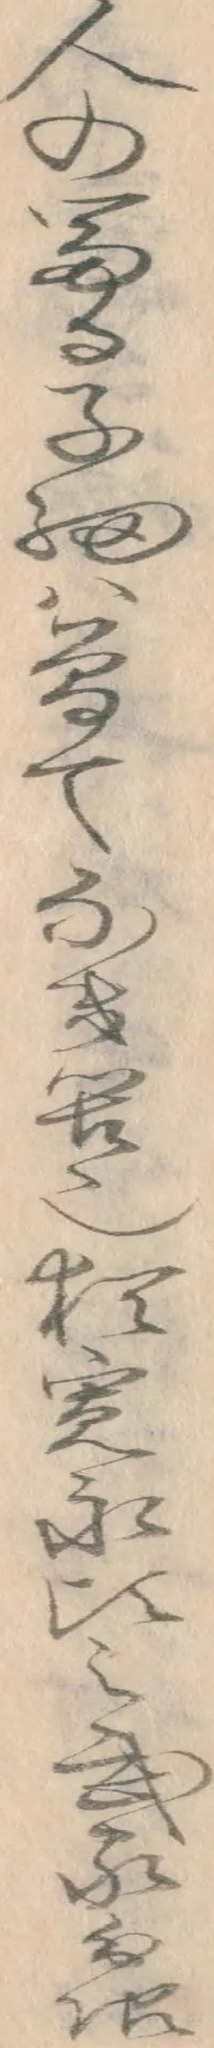人の富る子細は曽てなき筈也猶寛永頃の武家分限
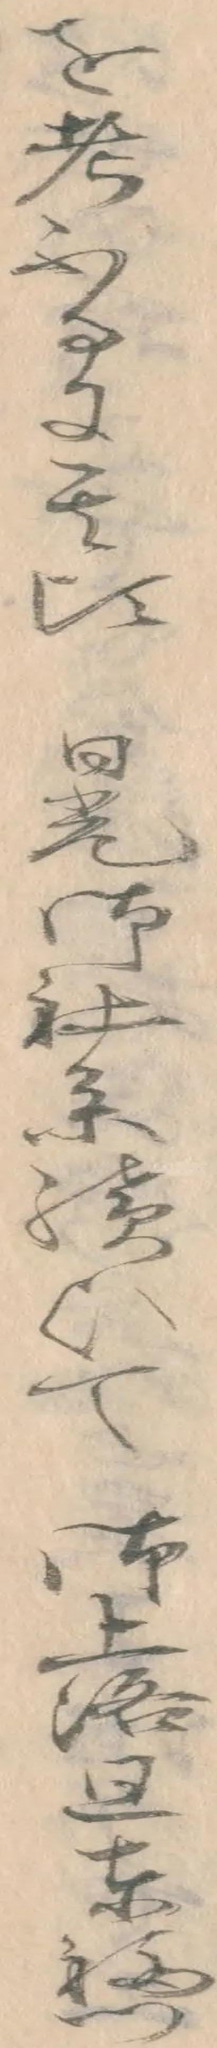を考ふるに其頃日光御社参続ひて御上洛且東福門
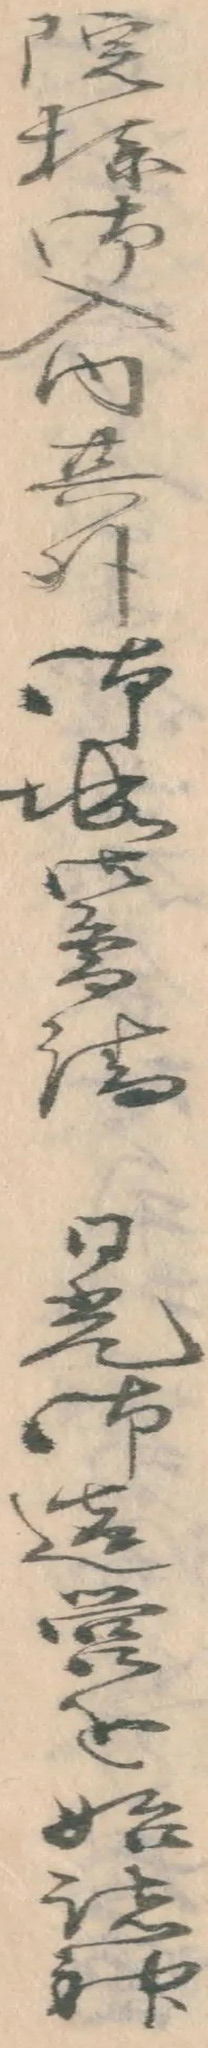院様御入内其外御城御普請日光御造営を始諸神
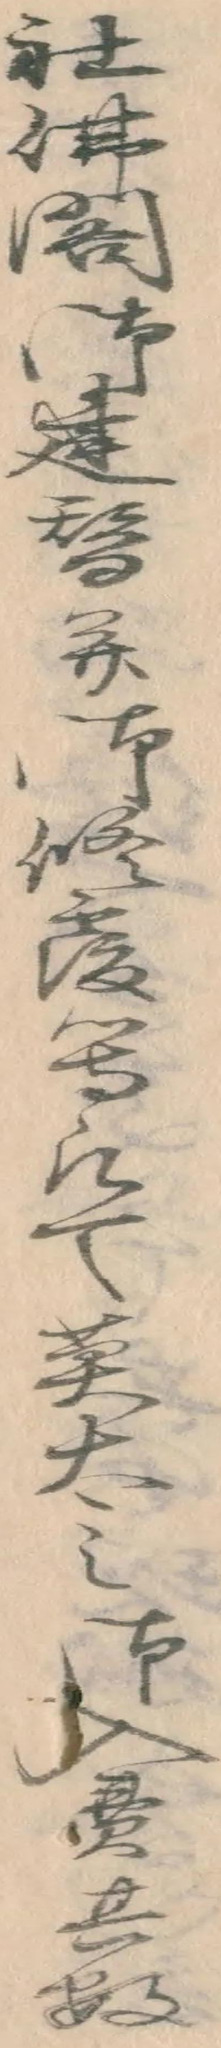社仏閣御建替并御修覆等凡て莫太之御入費其数
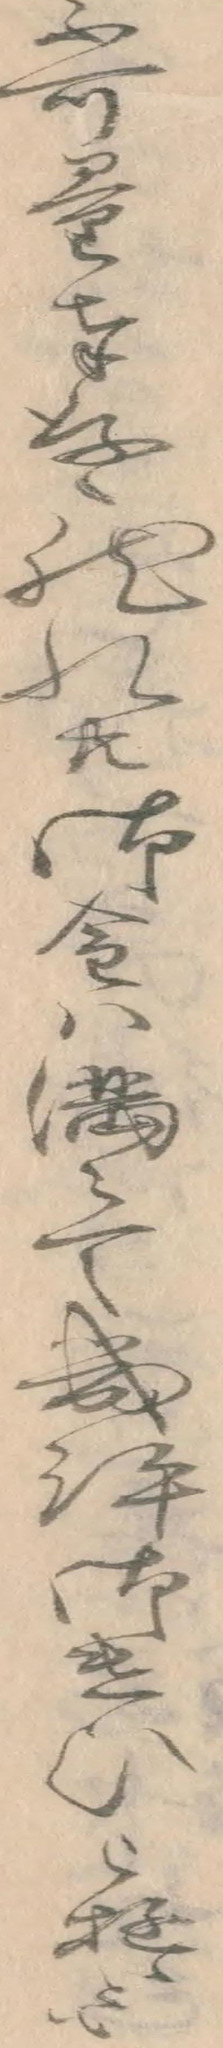不可量奉存候然れ共御金は満々て幾許御遣ひ被遊候とも
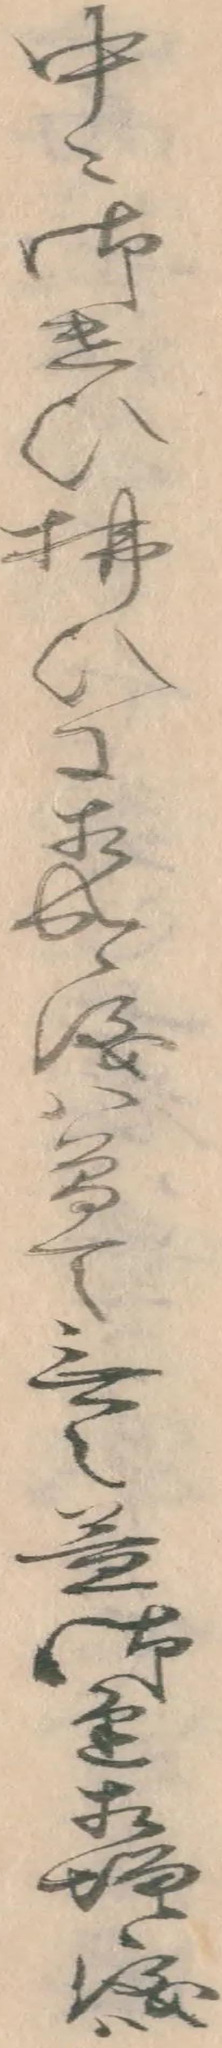中々御遣ひ払ひに相成候儀は曽て無之益御金相増候儀は
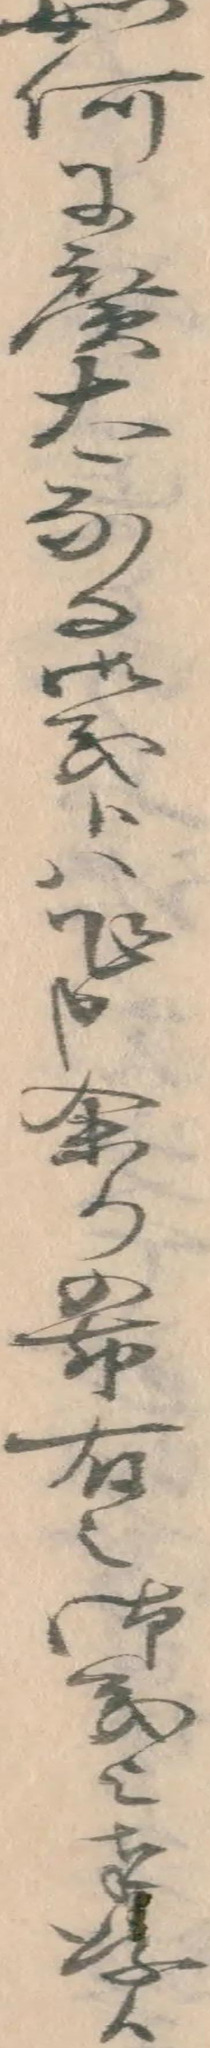如何に広太なる御義とは乍申余り希有之御義と奉存候
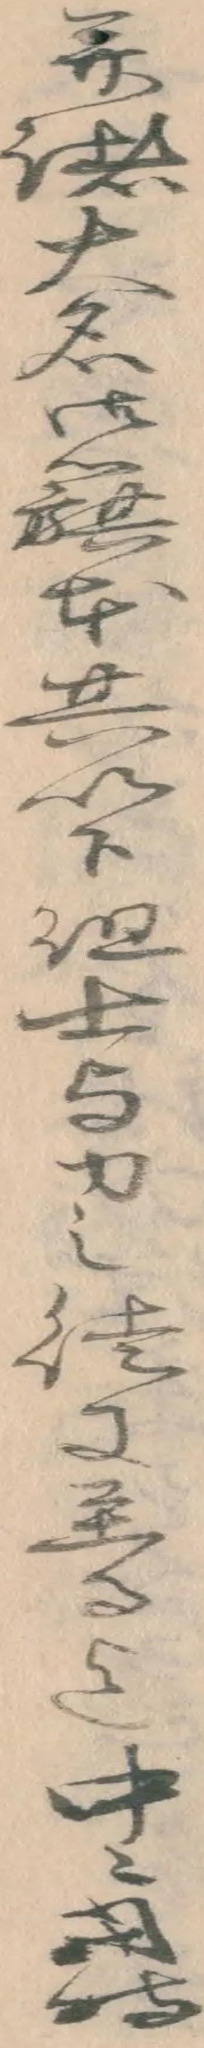并諸大名御籏本其以下組士与力之徒に至る迄中々当時
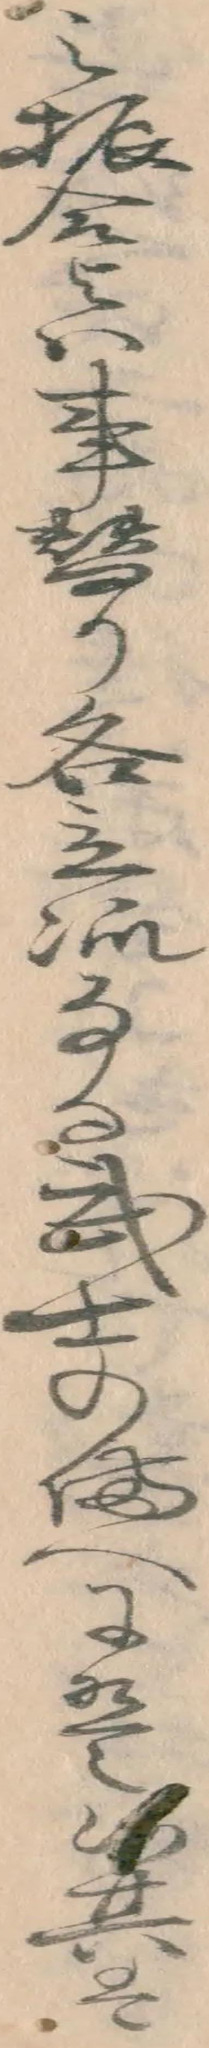之振合とは事替り各立派なる武士の備へに有之候其は
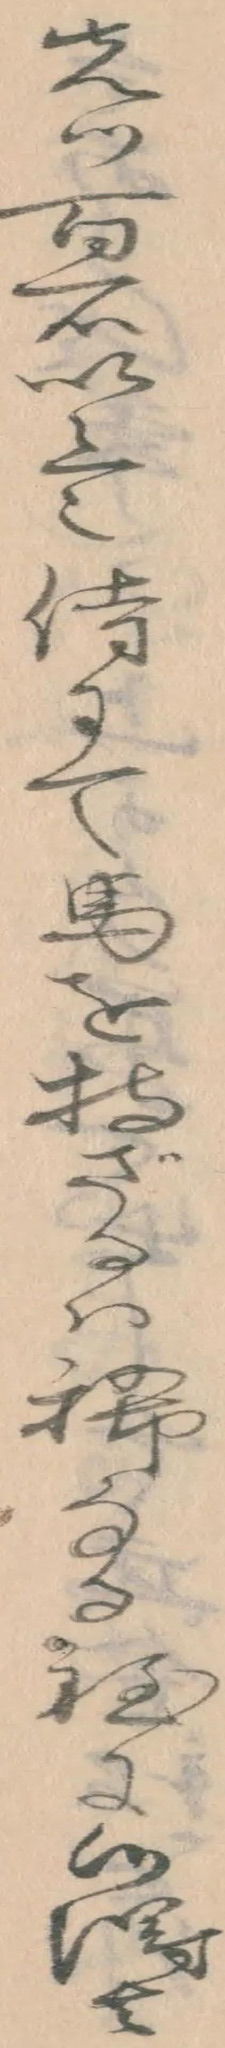先つ百石以上之侍にて馬を持ざるは稀なる程に候得者
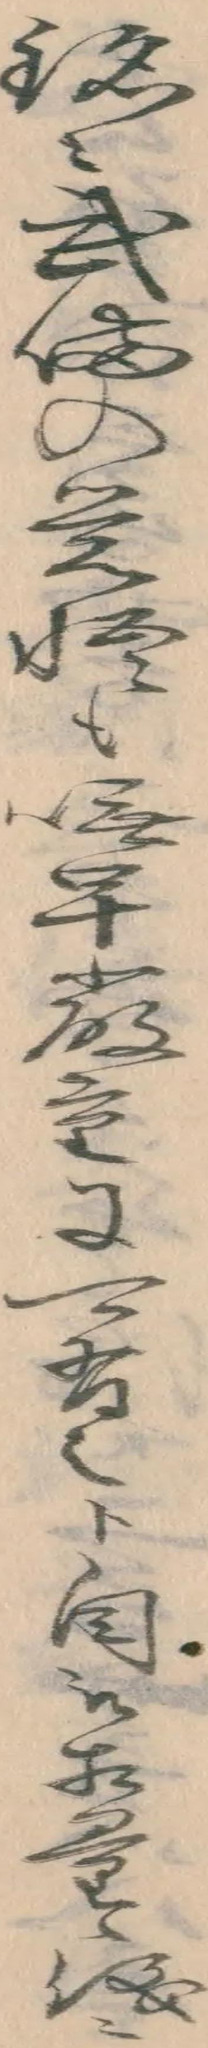銘々武備の覚悟も嘸早厳重に可有之と自被相量候儀に
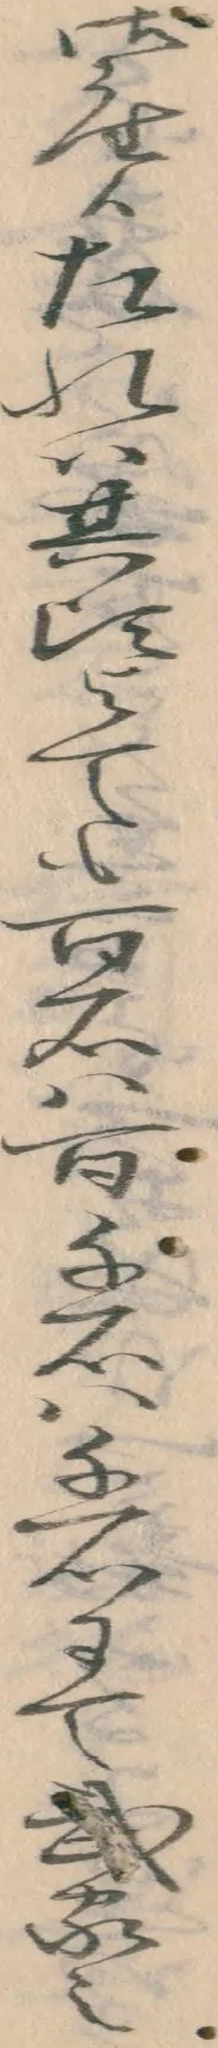御座候左れは其頃とても百石は百千石は千石にて武家之
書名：斎庭之穂
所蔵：国立国会図書館 National Diet Library, JAPAN
